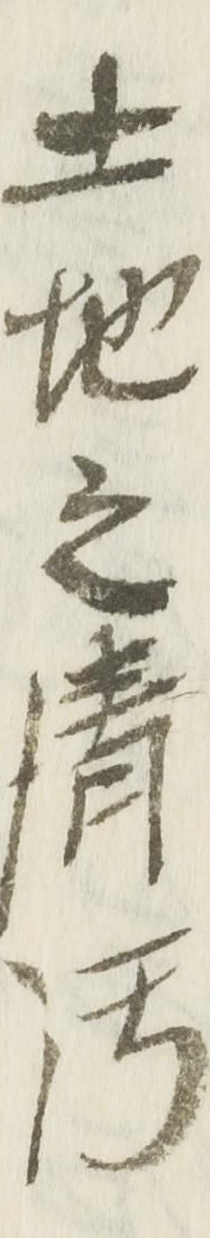土地之清汚
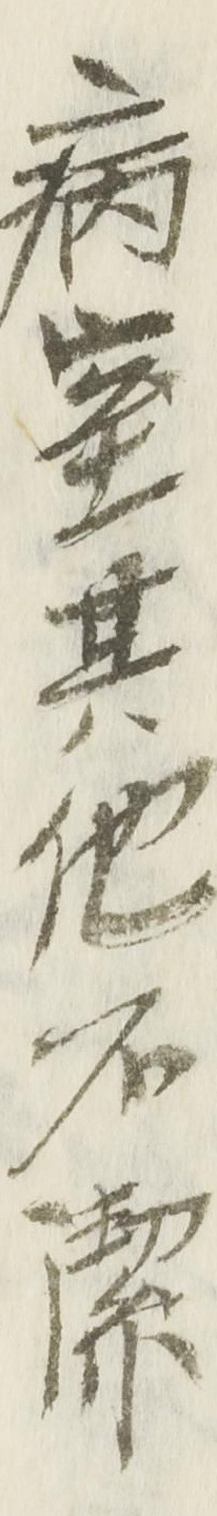病室其他不潔
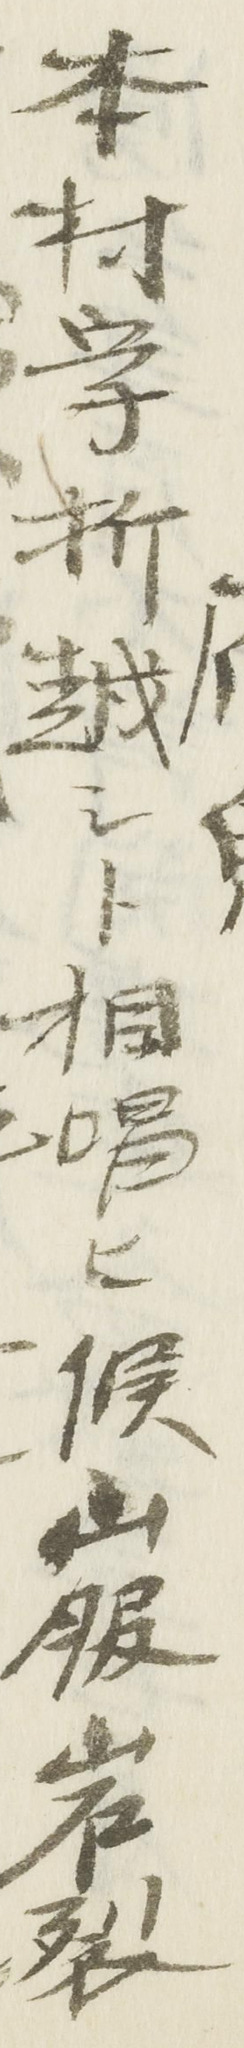本村字折越シト相唱ヒ候山腹岩裂
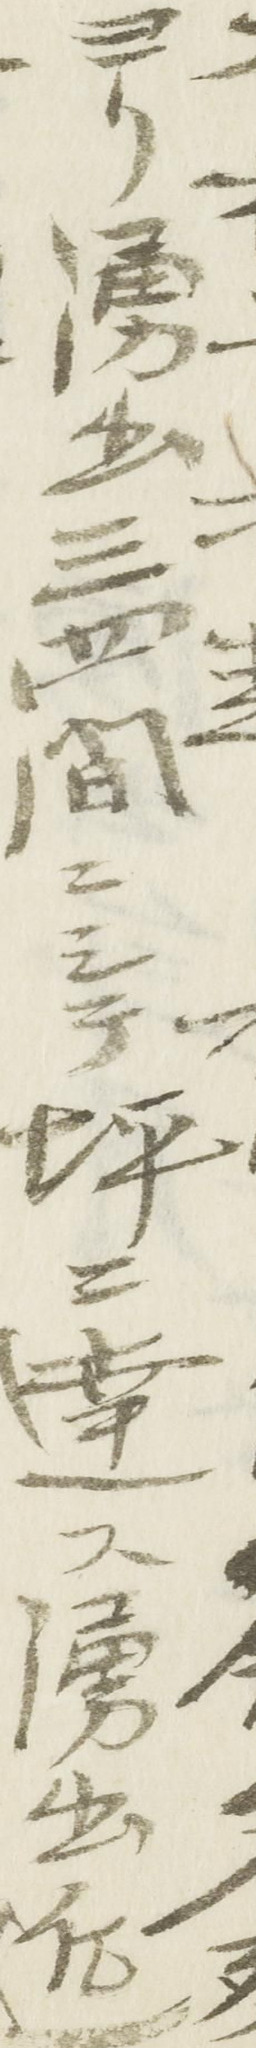ヨリ湧出三四間ニシテ坪ニ達ス湧出近
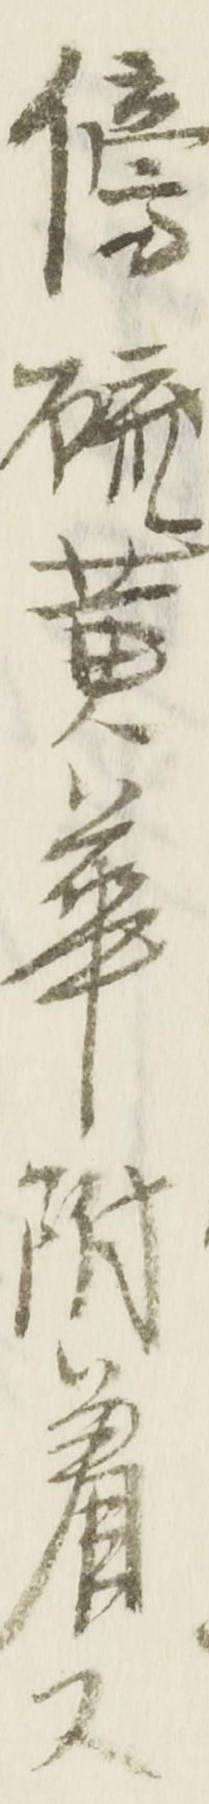傍硫黄華附着ス
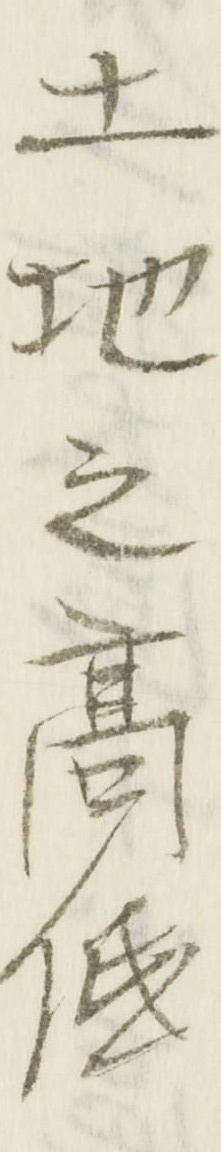土地之高低
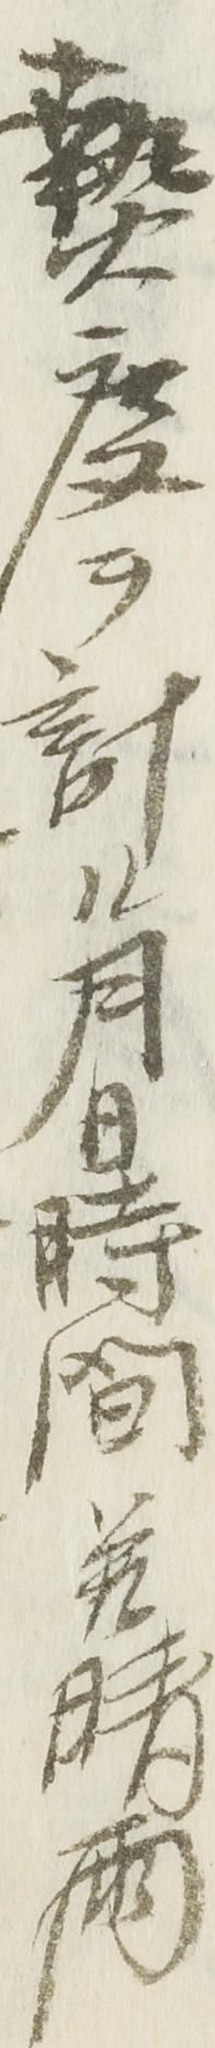熱度ヲ計ル月日時間幷晴雨
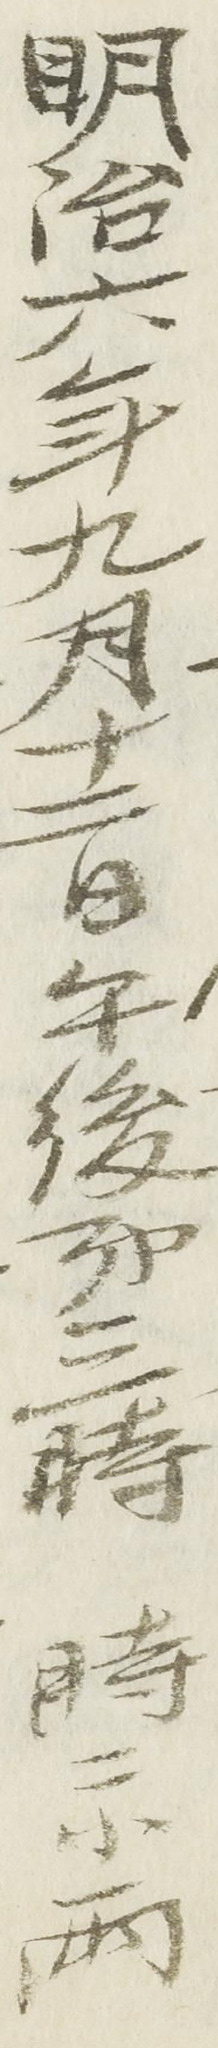明治六年九月十二日午後第三時時ニ小雨
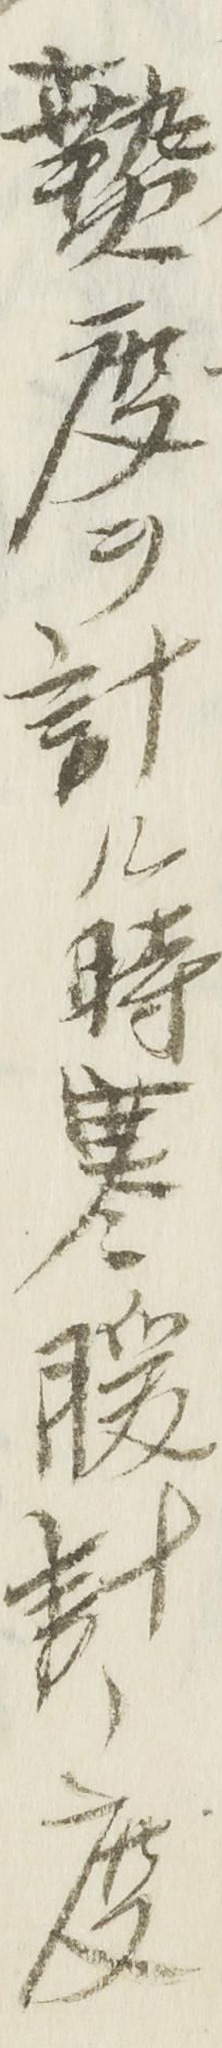熱度ヲ計ル時寒暖計ノ度
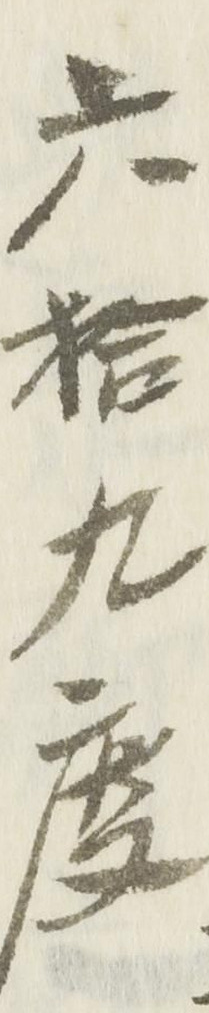六拾九度
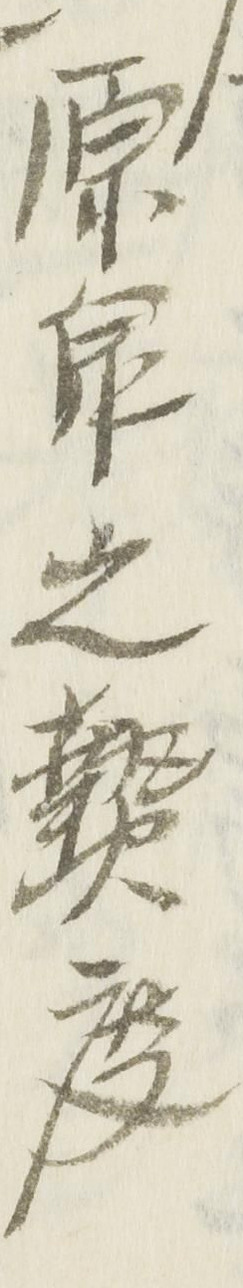原泉之熱度
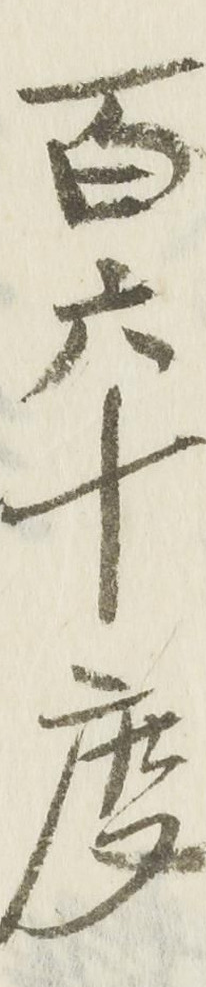百六十度
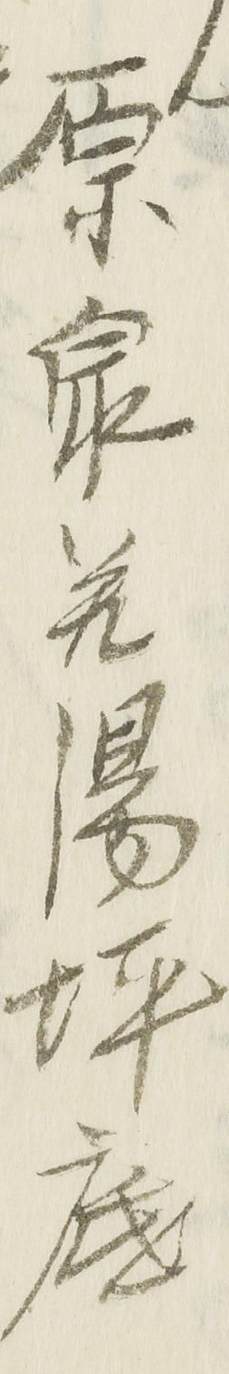原泉并湯坪底
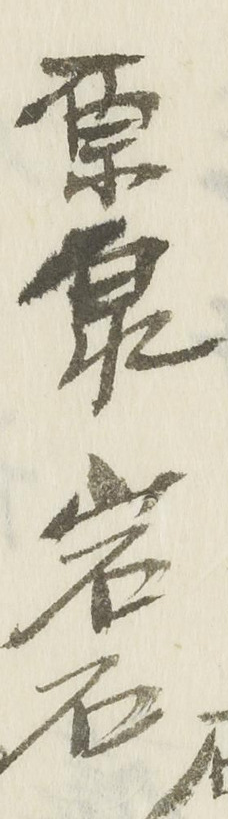原泉岩石
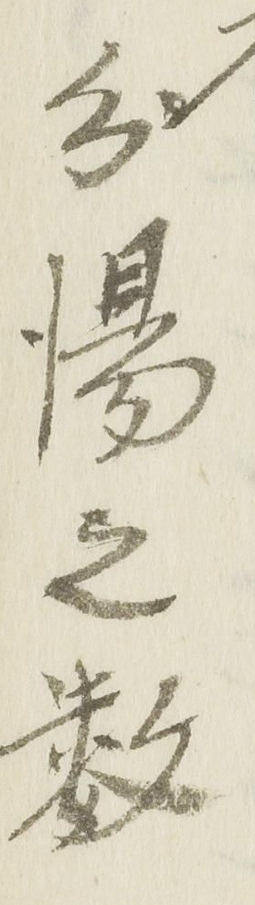分湯之数

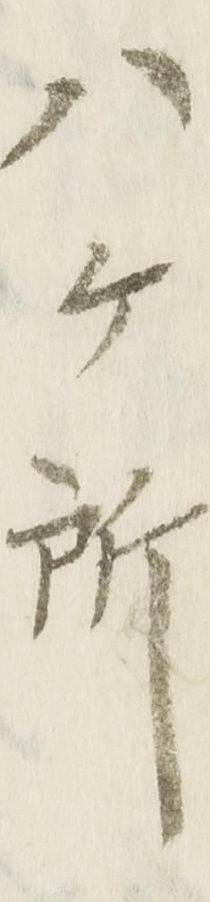八ケ所
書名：温冷泉試験表
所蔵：東京大学地震研究所図書室 Earthquake Research Institute Library, The University of Tokyo, JAPAN
